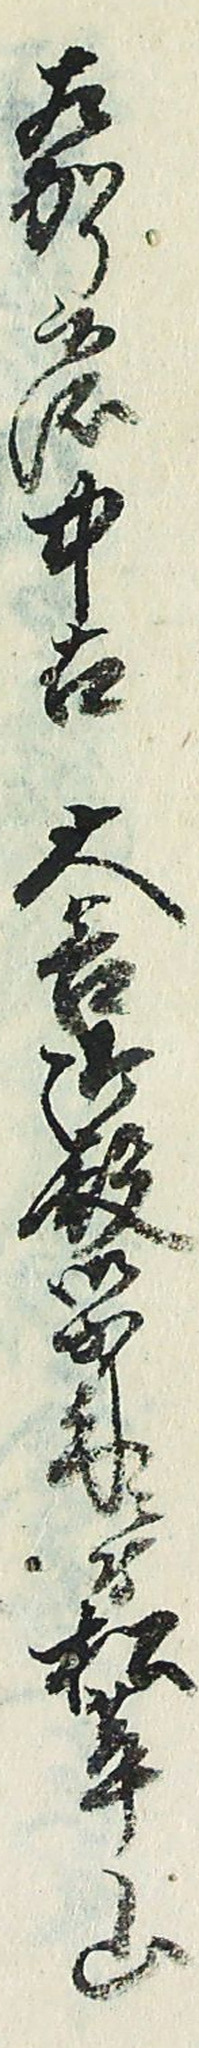相加り候所中古大谷御殿御出来に付松茸山
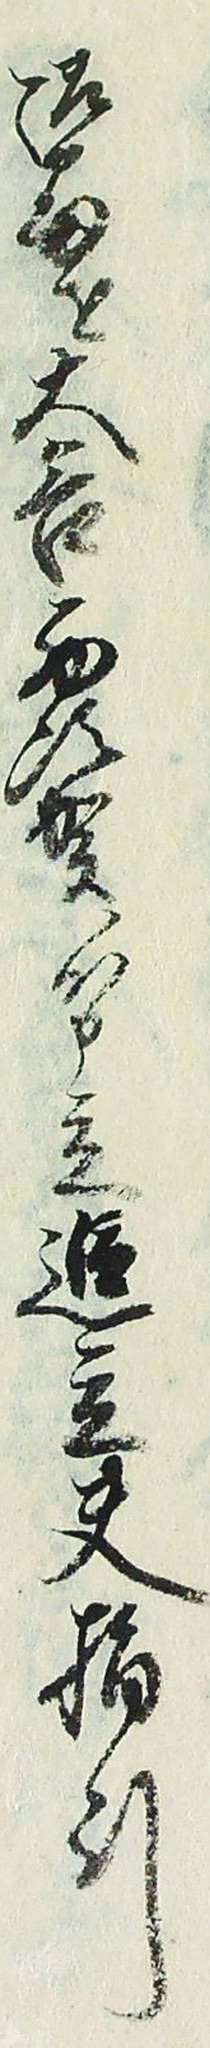御番を大谷西須賀より申立追立夫指引
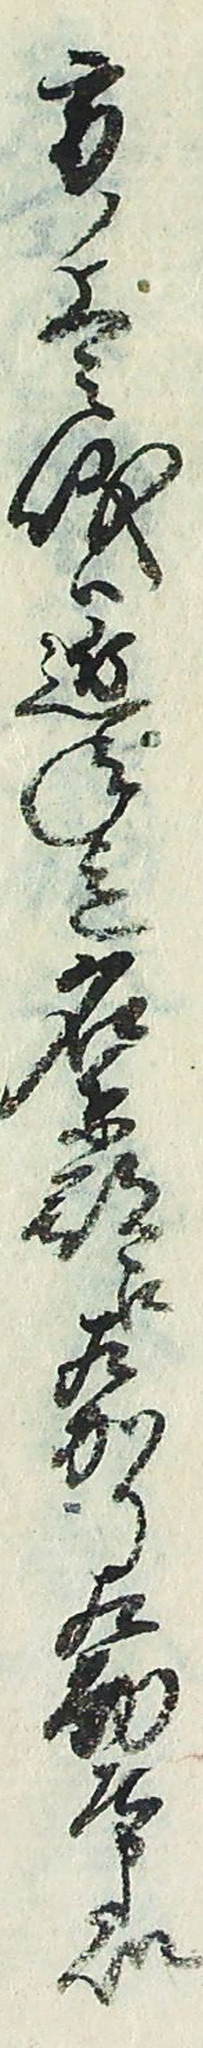方ノ上の儀は近年迄名東郡え相加り相勤居申候処
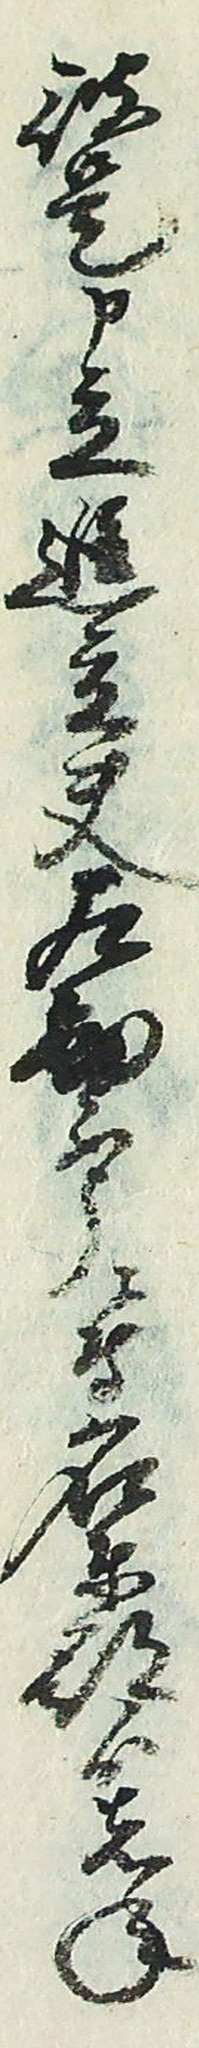彼是申立追立夫相勤不申に付名東郡より先年
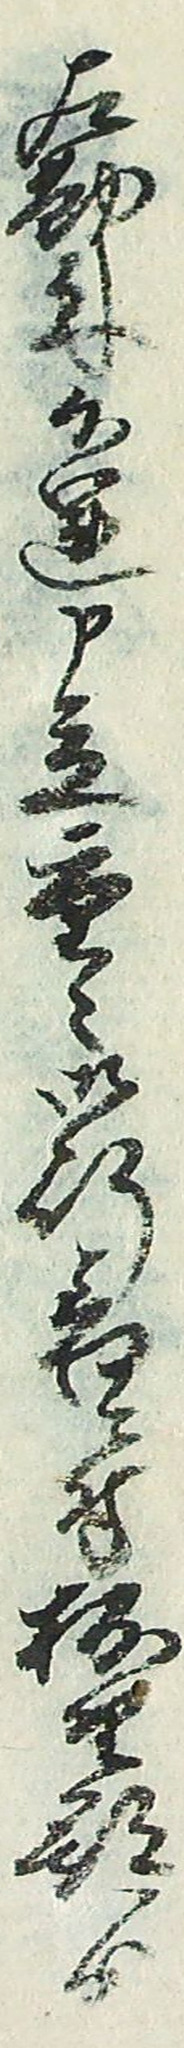相勤来候運申立重々御行着に付板野郡より
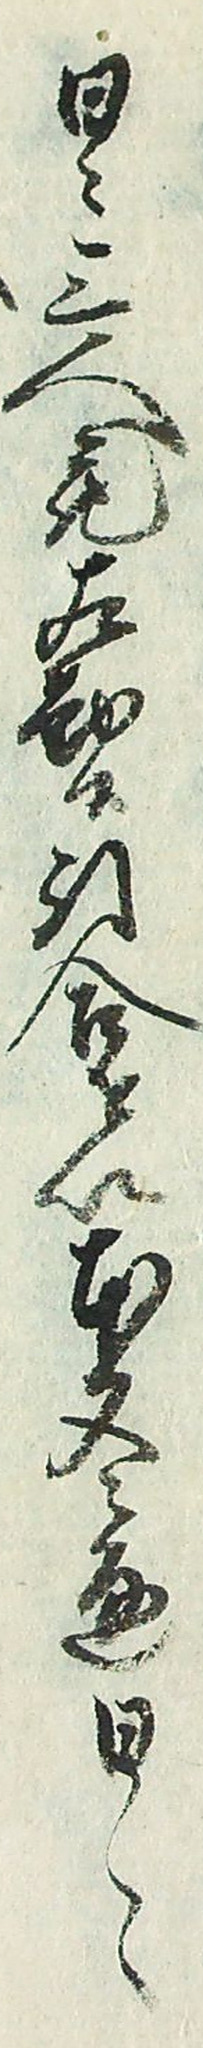日々三人宛相勤候引合を以本文の通日々
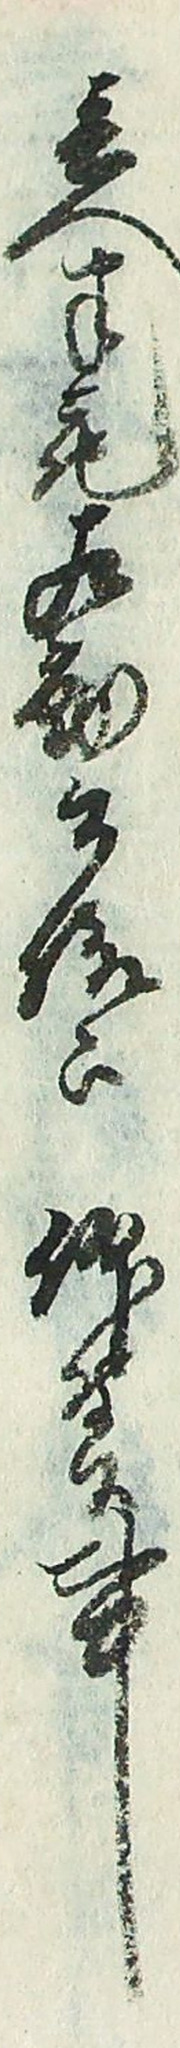一人半宛相勤候様被仰付候事

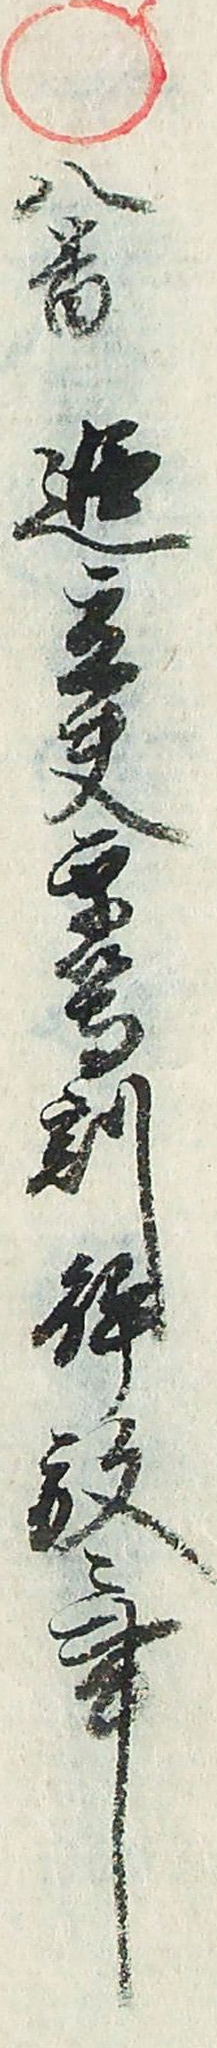八番一追立夫平等割解放之事
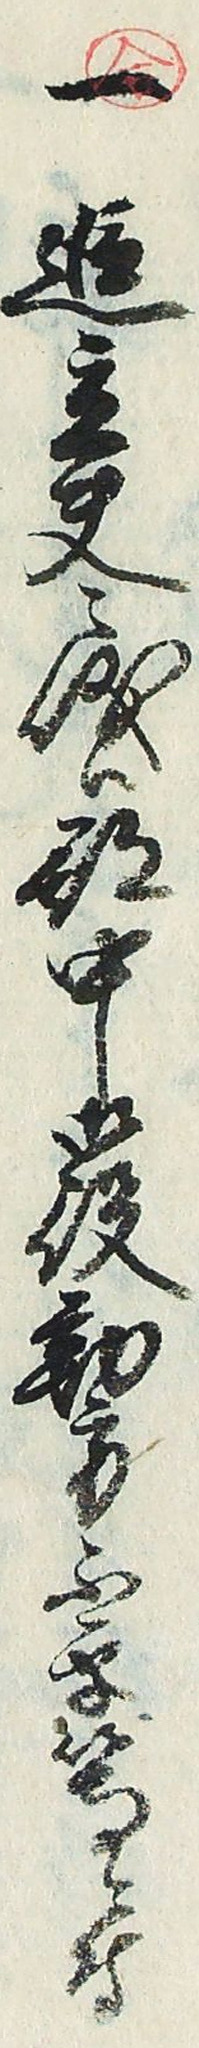一追立夫の儀は郡中御役勤方不平等に付
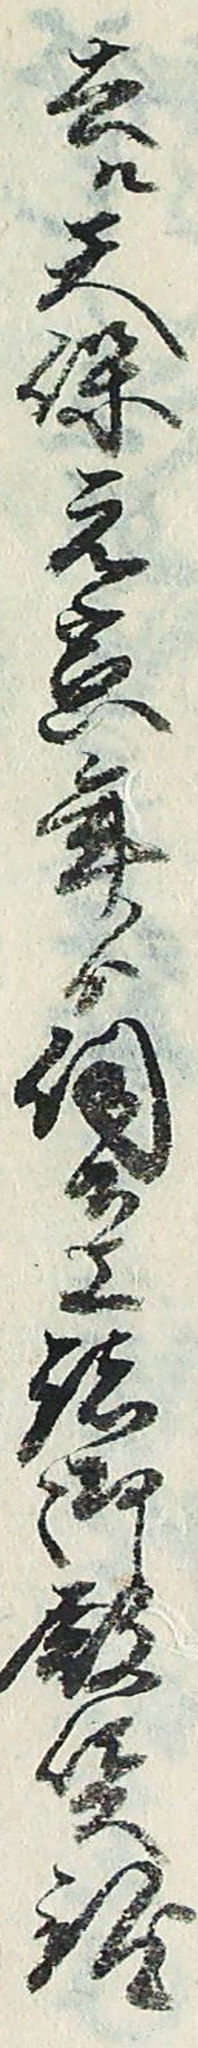去る天保元寅年より伺候上諸御殿賃銀
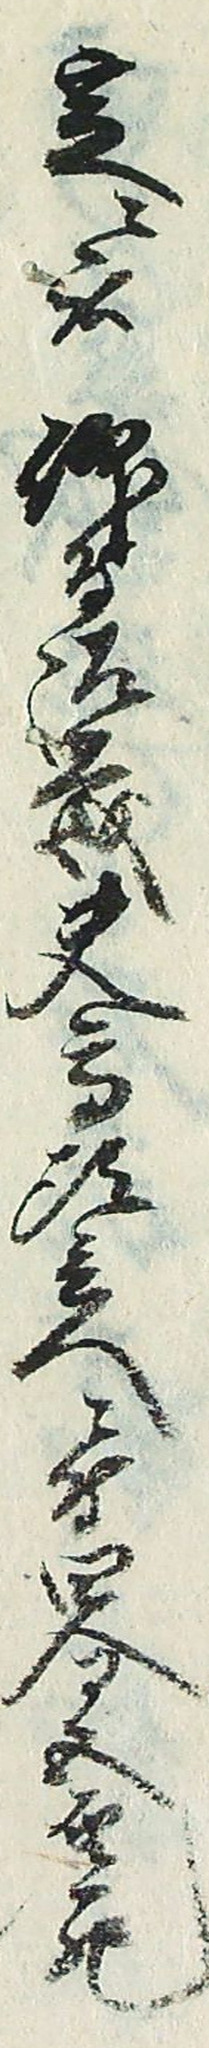定に被仰付御蔵夫高頭一人に付四分五厘宛
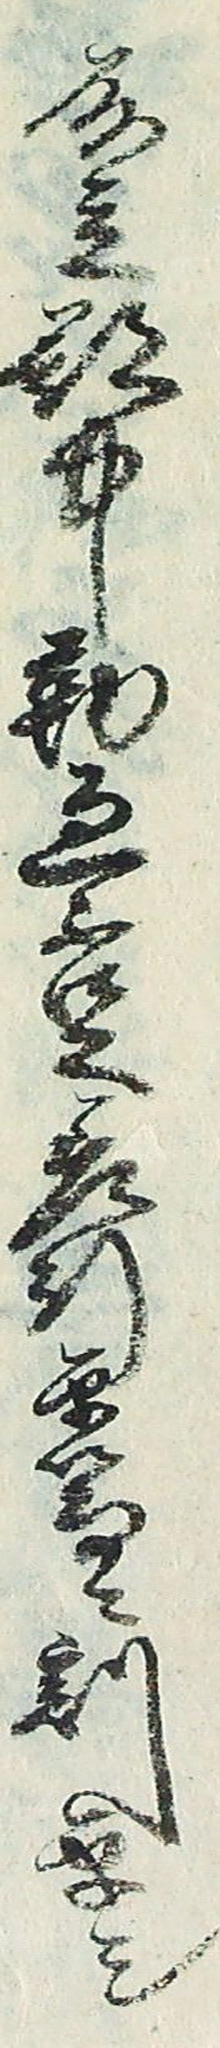取立郡中勤過不足差引平等に割平し
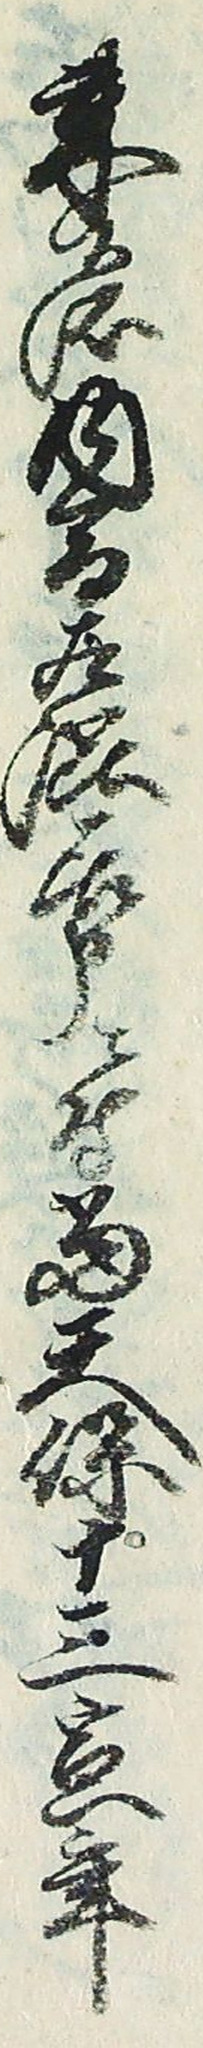来候所内間相混居申に付当天保十三寅年
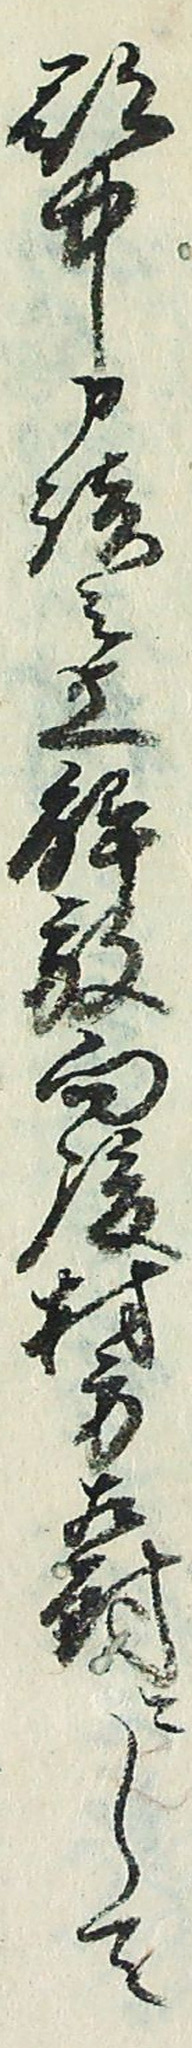郡中申談の上解放向後村方相対にして
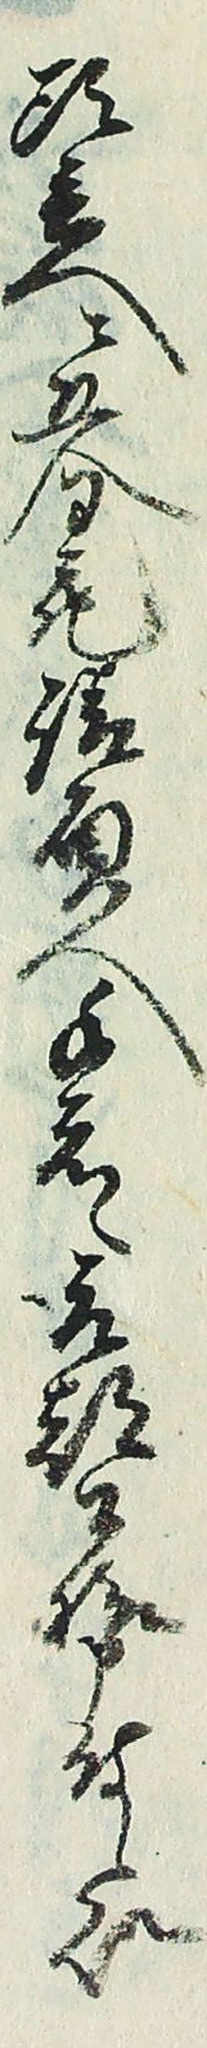頭一人に付五分宛請負人手元へ取都候様申付候処
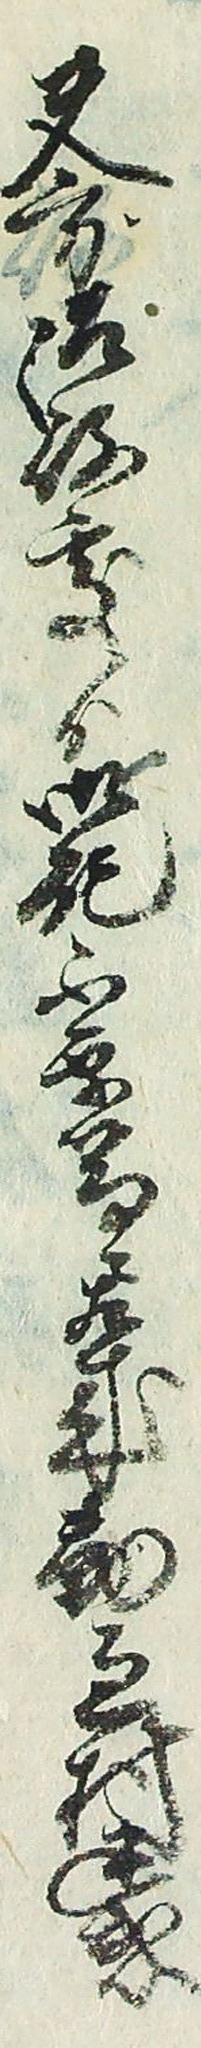夫方御役処より御配不平等に相成勤過村迷惑
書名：諸割賦物賃銀定記録帳
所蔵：鳴門教育大学 Naruto University of Education
